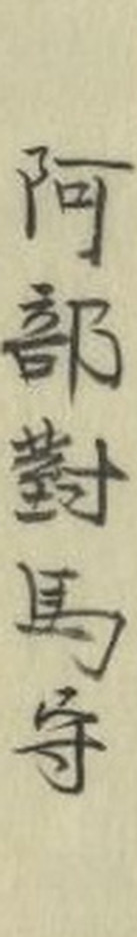阿部對馬守
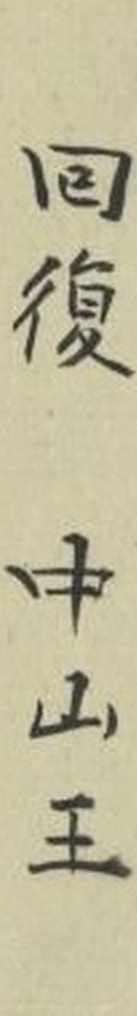回復中山王
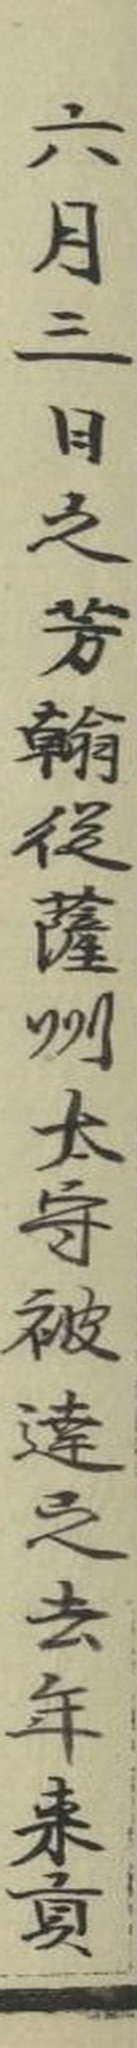六月三日之芳翰従薩州太守被達之去年来貢
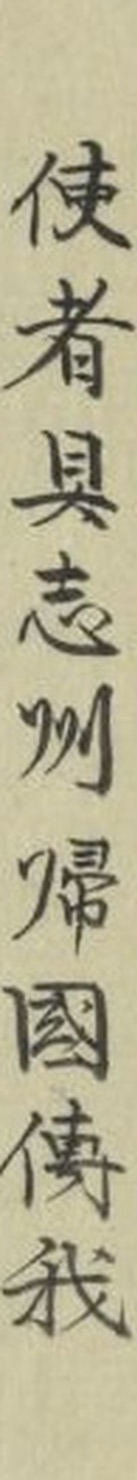使者具志州帰国伝我
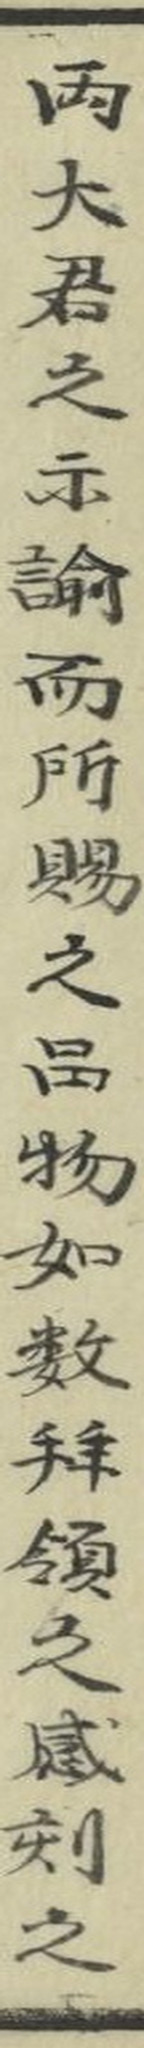両大君之示諭而所賜之品物如数拝領之感刻之
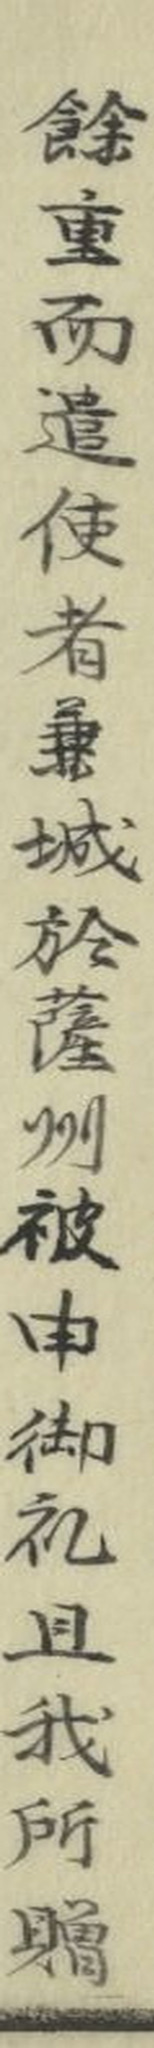余重而遣使者兼城於薩州被申御礼且我所贈
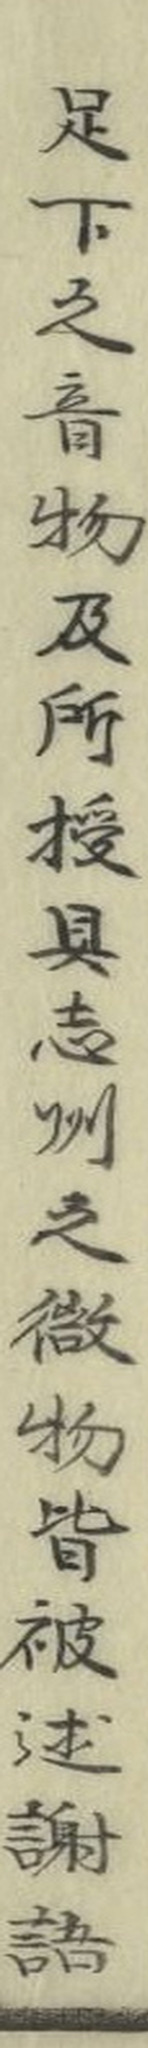足下之音物及所授具志州之微物皆被述謝語
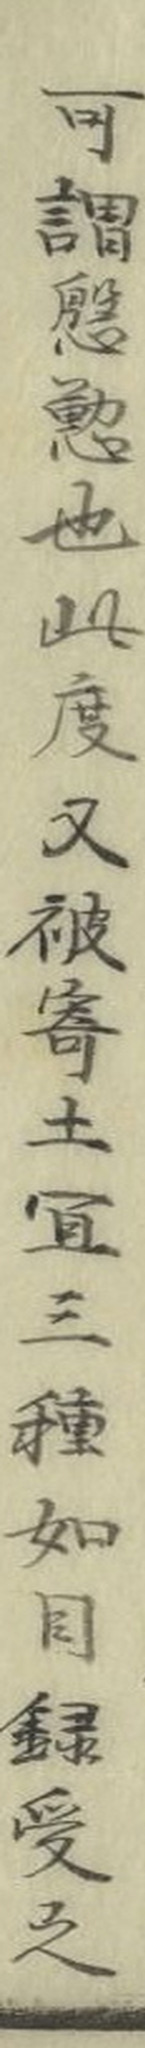可謂慇懃也此度又被寄土冝三種如目録受之
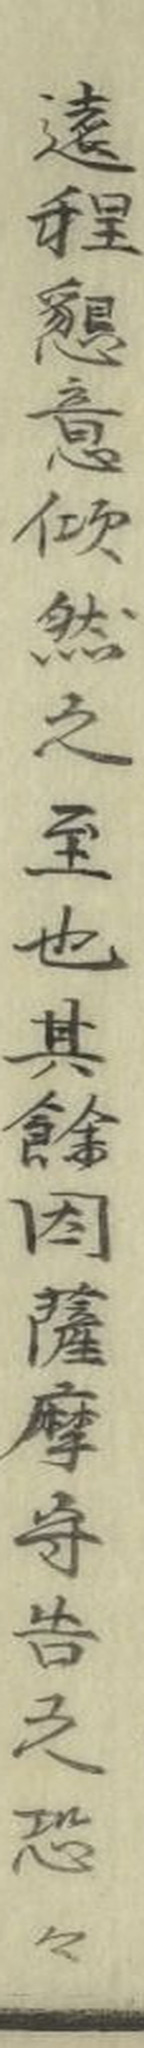遠程懇意傾然之至也其余因薩摩守告之恐々
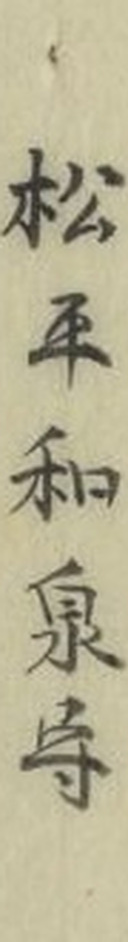松平和泉守

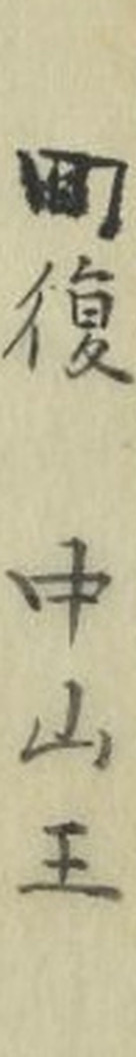回復中山王
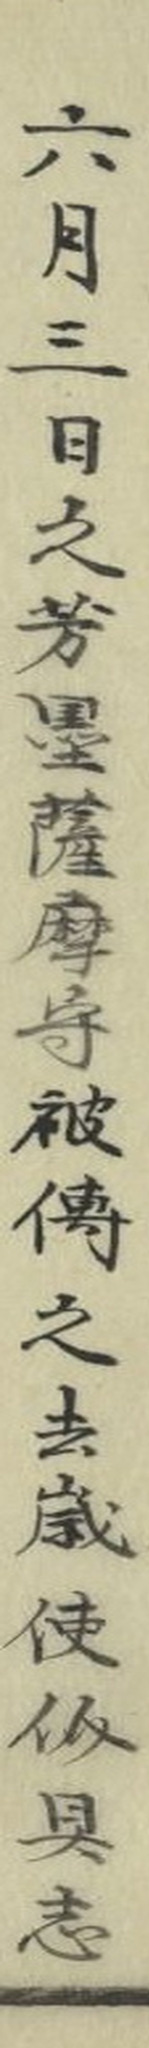六月三日之芳墨薩摩守被伝之去歳具志
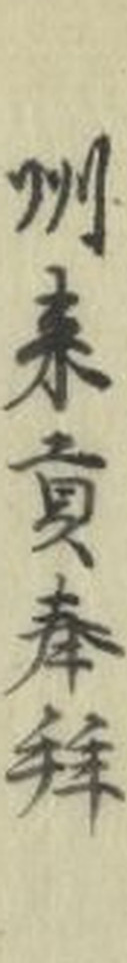州来貢奉拝
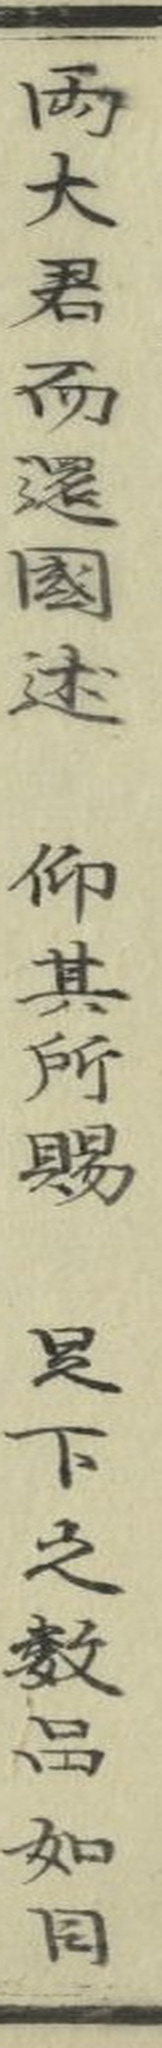両大君而還国述仰其所賜足下之数品如目
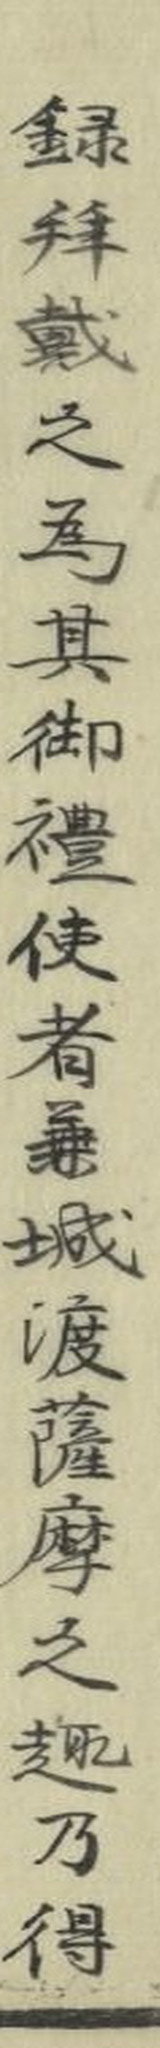録拝載之為其御礼使者兼城渡薩摩之趣乃得
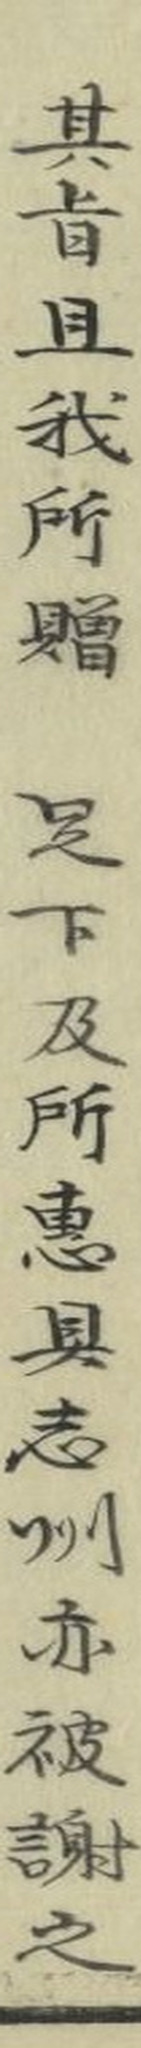其旨且我所贈足下及所恵具志州亦被謝之
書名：琉球往来（上）
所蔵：University of the Ryukyus Library
